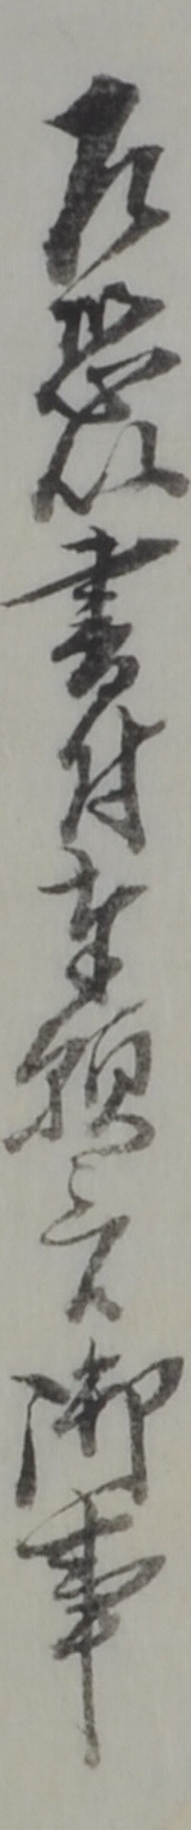乍恐以書付奉願上候御事
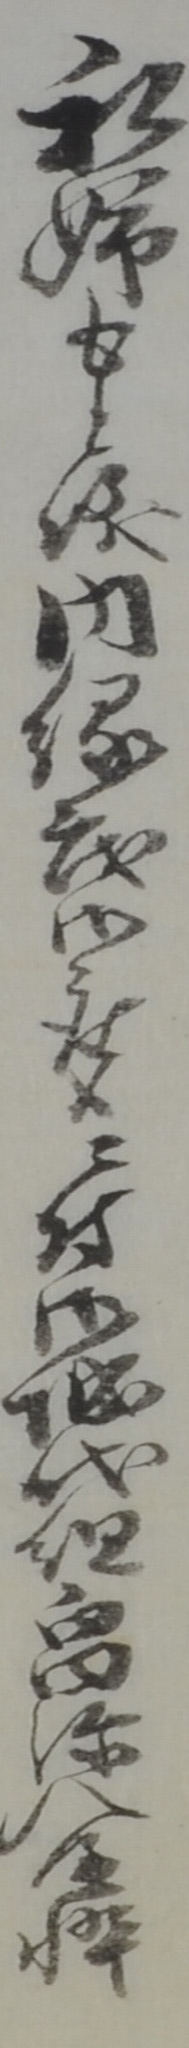私姉もと儀内縁も御座候ニ付御城代組畠源八殿悴
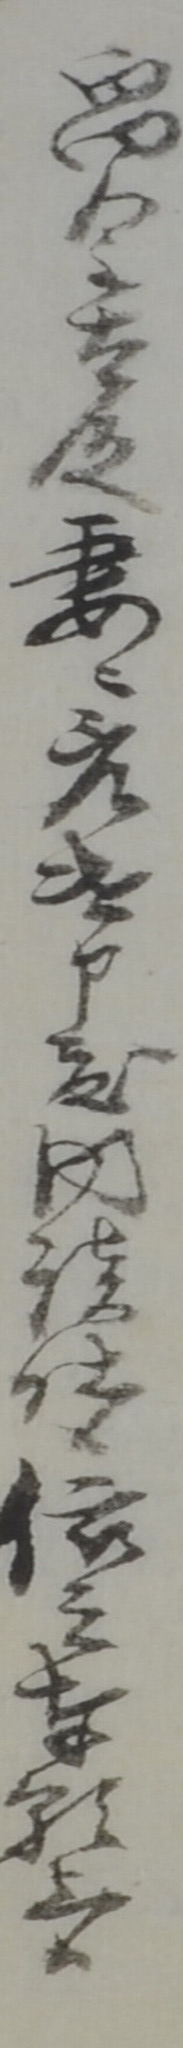畠金太殿妻に差遣申度内談仕候依之奉願上候
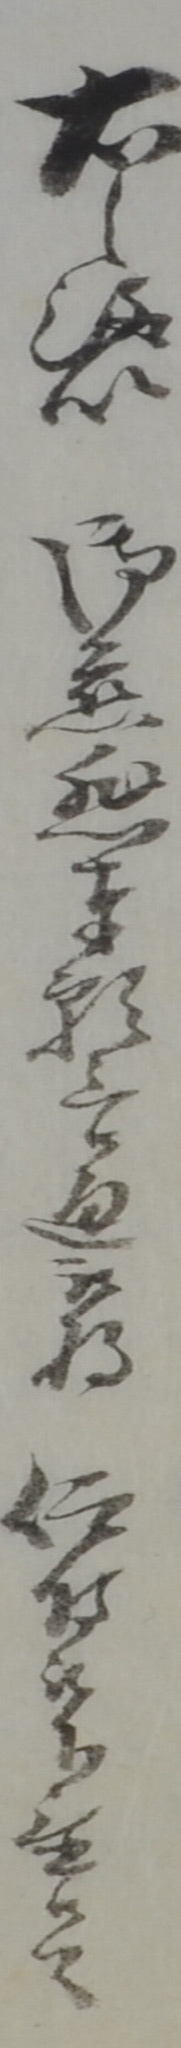右之趣以御慈悲奉願上候通被為仰付被下置候ハヽ
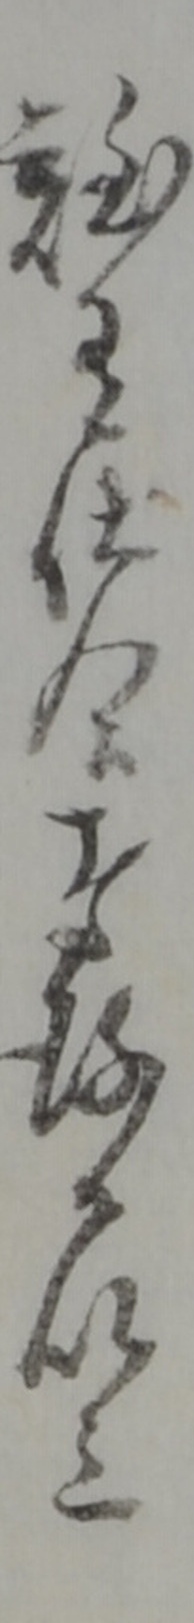難有仕合奉存候以上
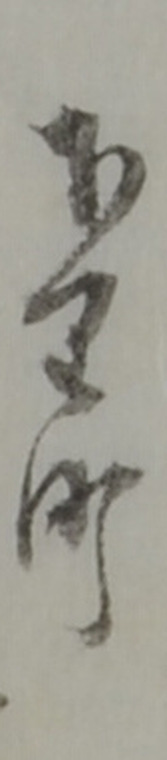下里町
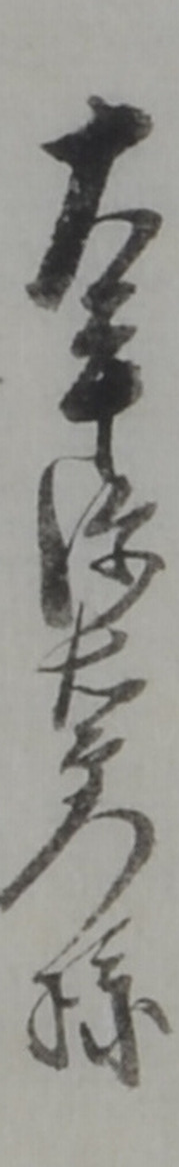大平源右衛門様
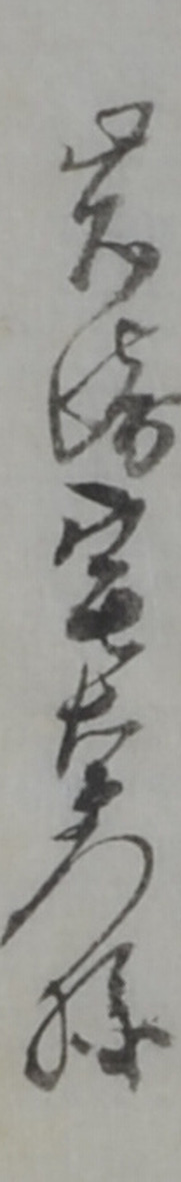岩崎宅右衛門様
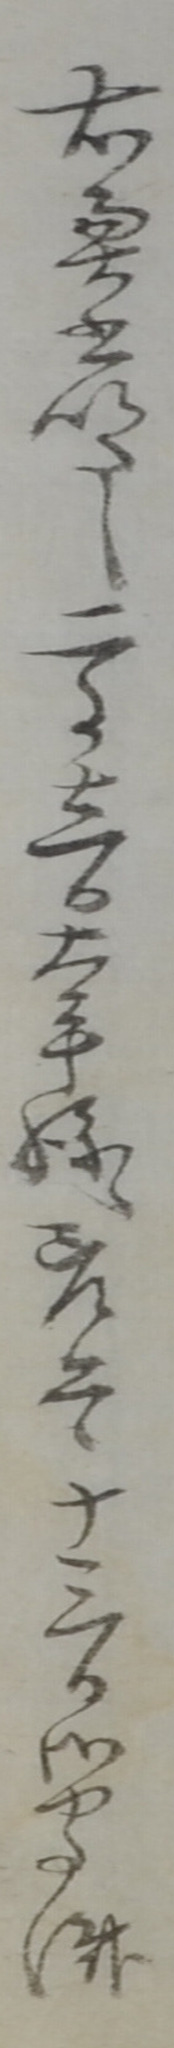右奥書いたし二月十一日大平様へ差上候十三日御聞済

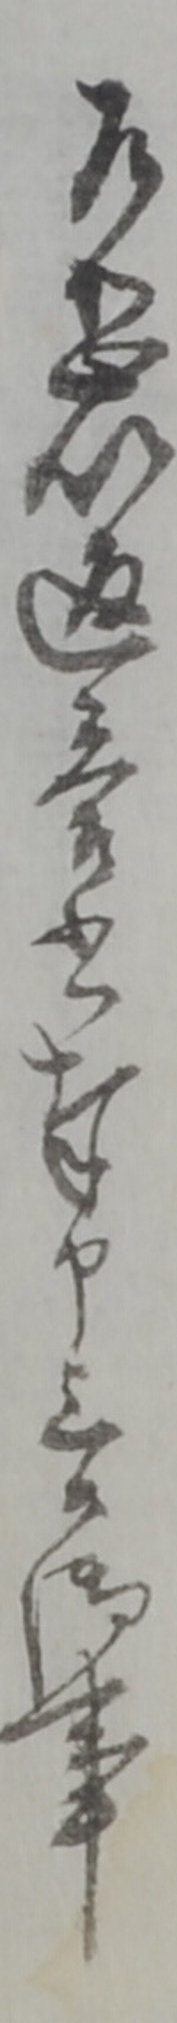乍恐以返答書奉申上候御事
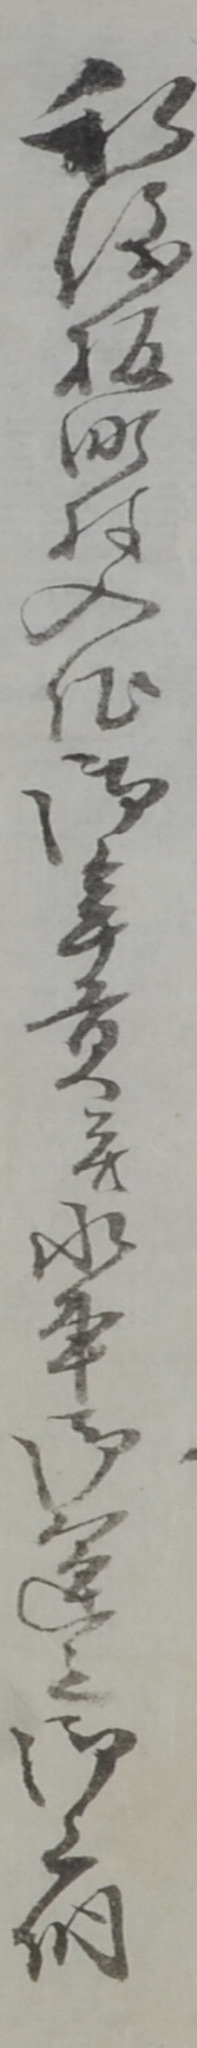私儀板町村入作御年貢幷水車御運上御上納
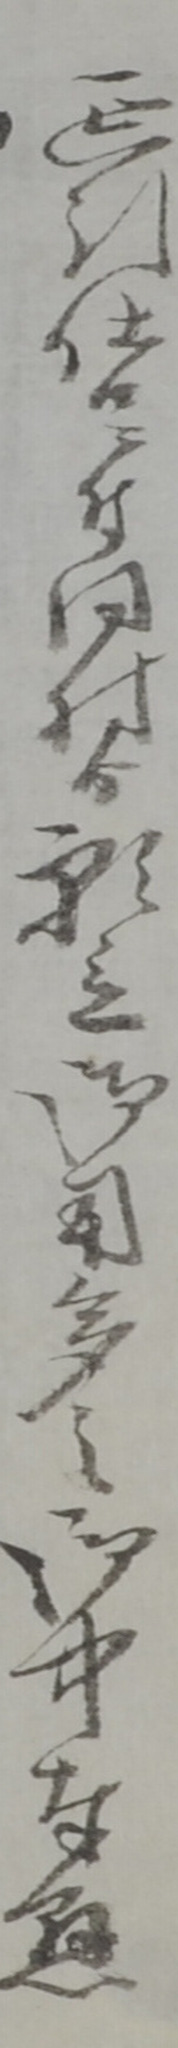延引仕候ニ付同村より願立御用多之御中奉懸
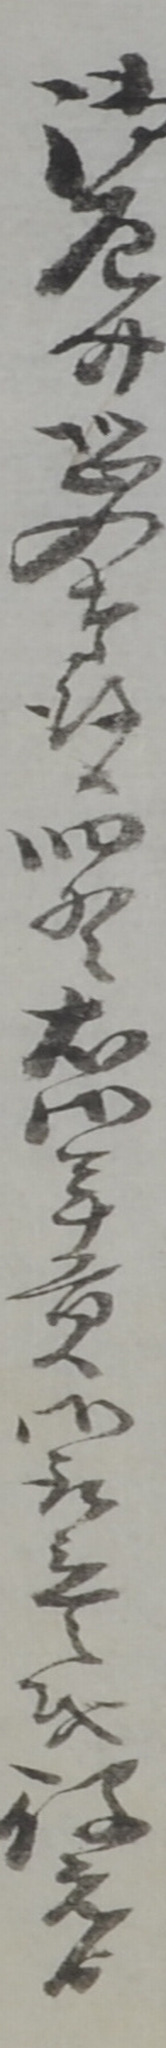御厄介恐入奉存候旧冬右御年貢御取立候義役元より
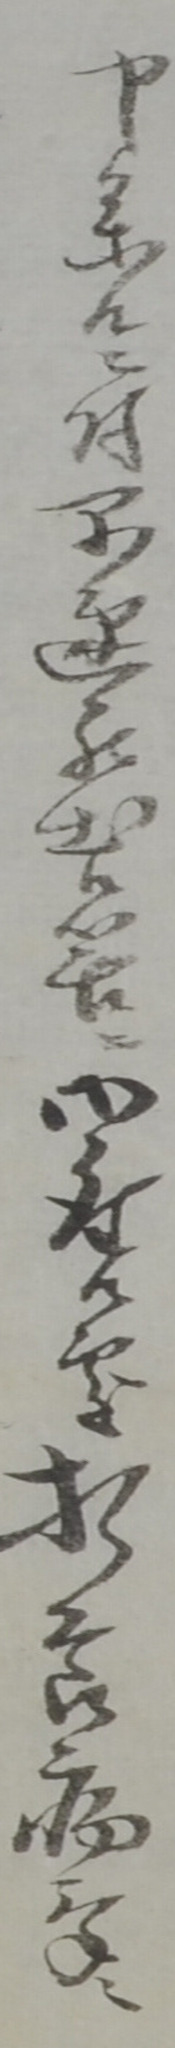申参候ニ付早速罷出候筈ニ御座候処折節病気ニ
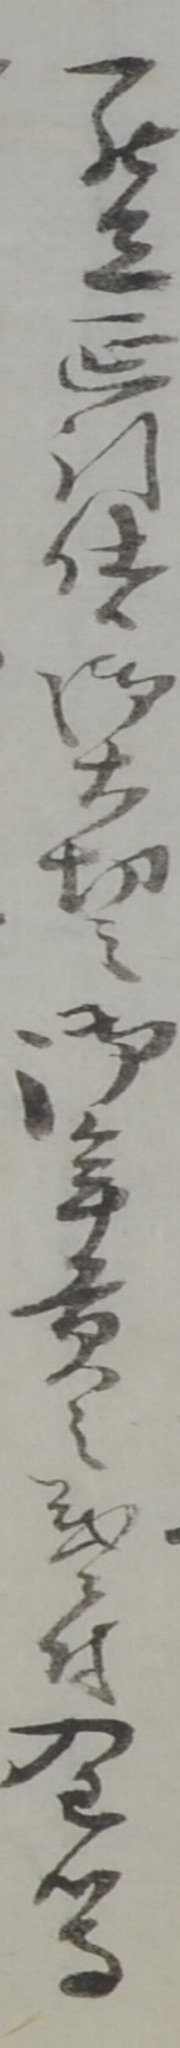罷在延引仕候御大切之御年貢之義ニ付全等
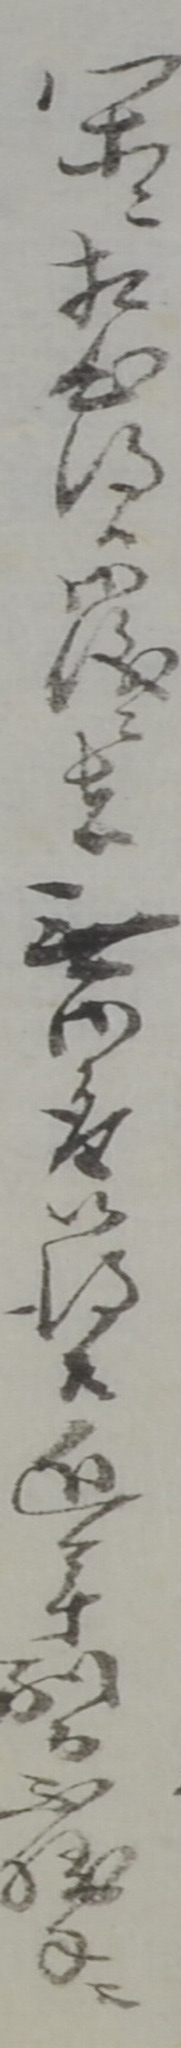閑ニ相心得候御儀ニ者無御座候得共近年別而不勝手ニ
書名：諸願書控帳
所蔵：伊那市立高遠町図書館・合同会社AMANE
